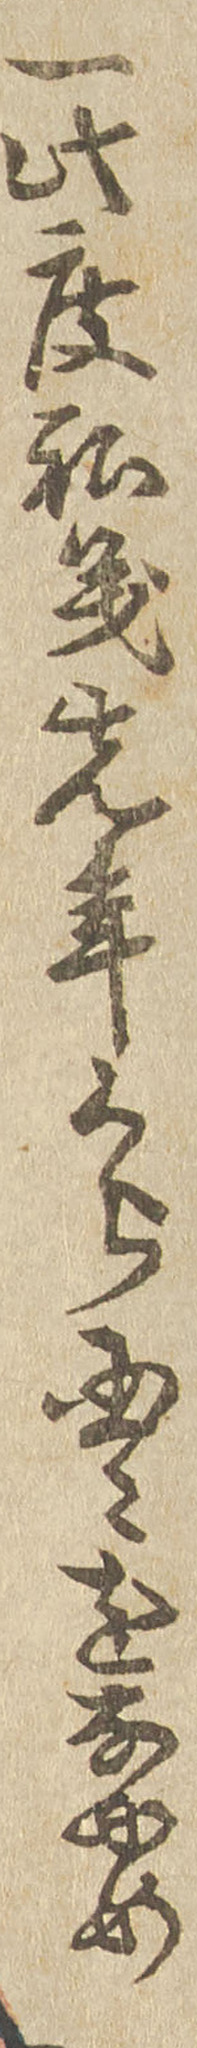一此度私義先年から国々をなやめ
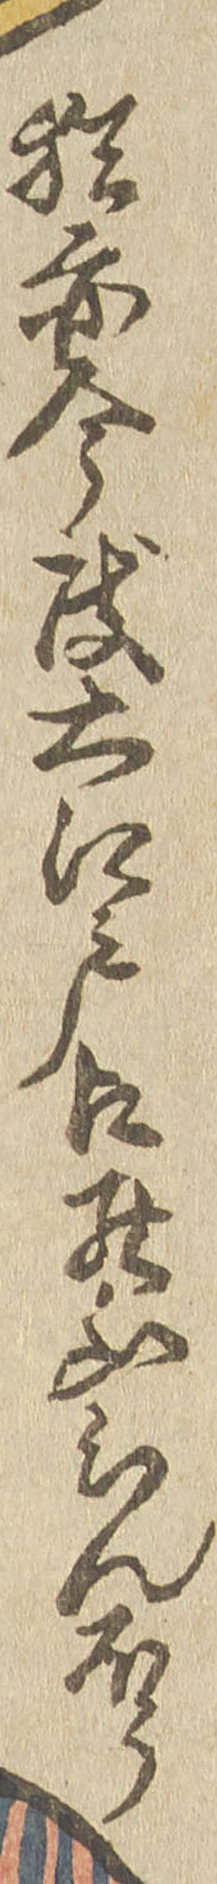猶亦今度大江戸えの御らんほう
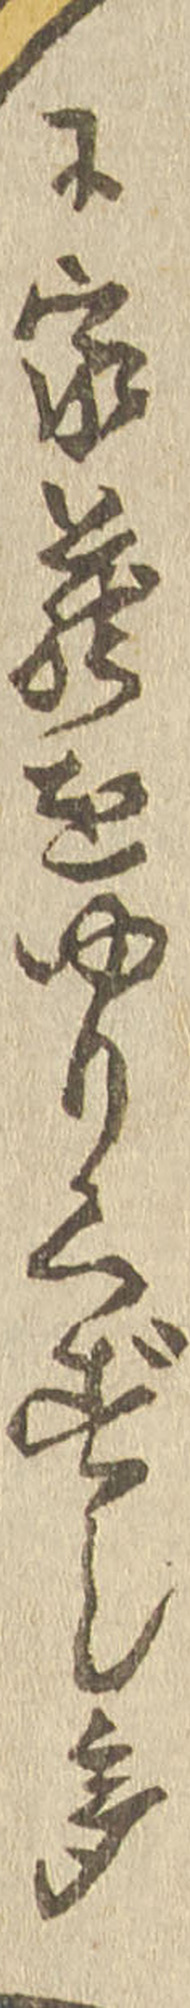に家蔵をゆりくずし多
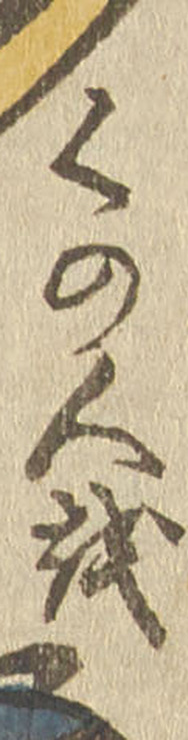くの人を
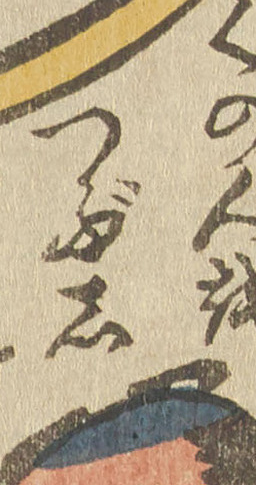つぶし
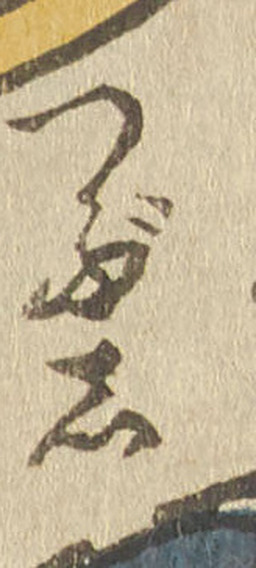つぶし
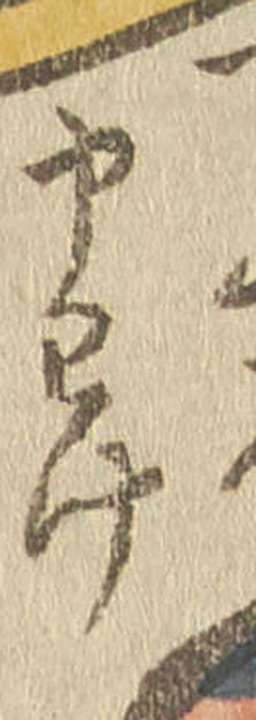申わけ
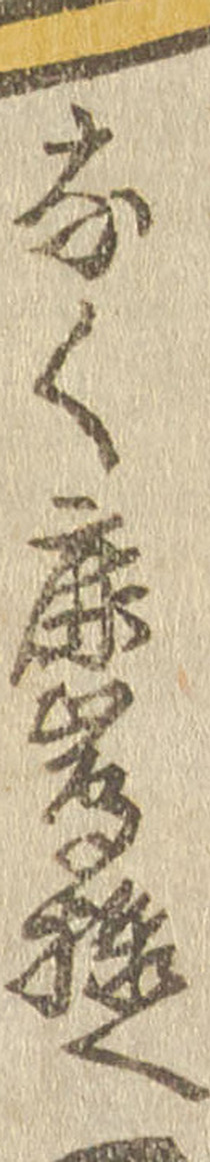なく鹿島様へ
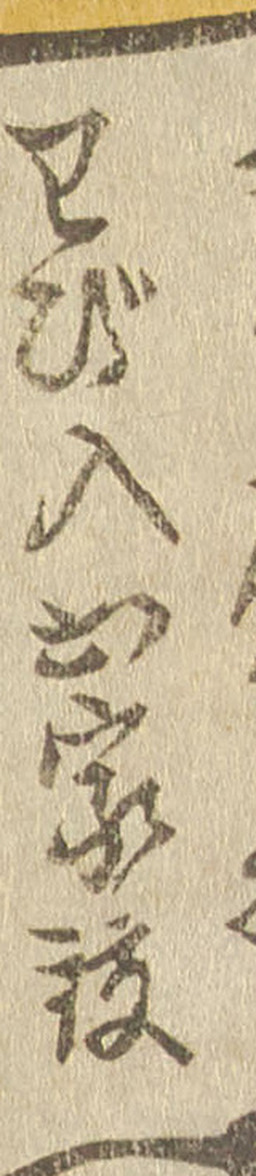わび入出家致
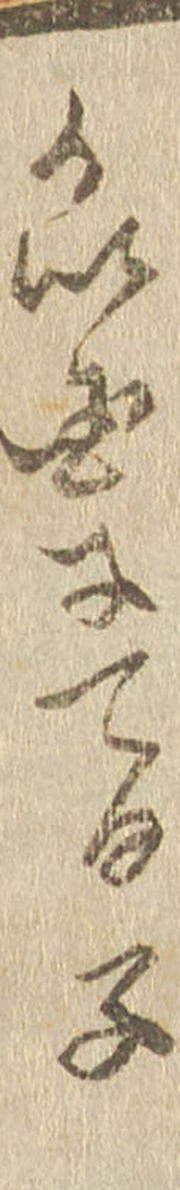かい国にてる
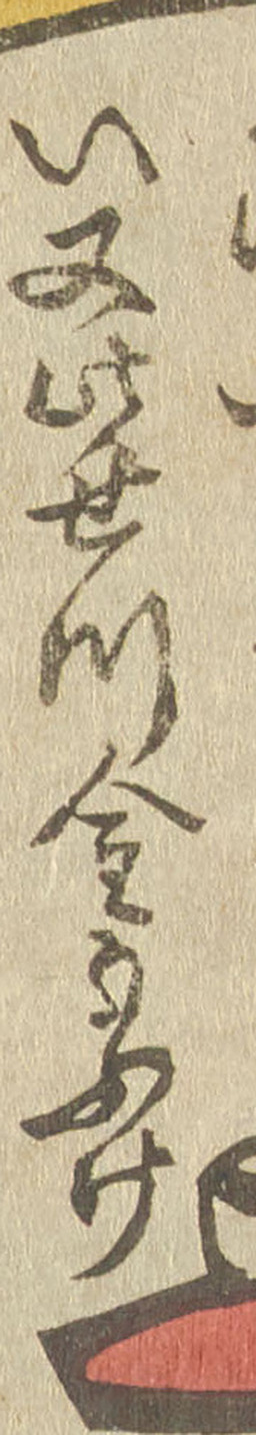い又此せつ金もふけ
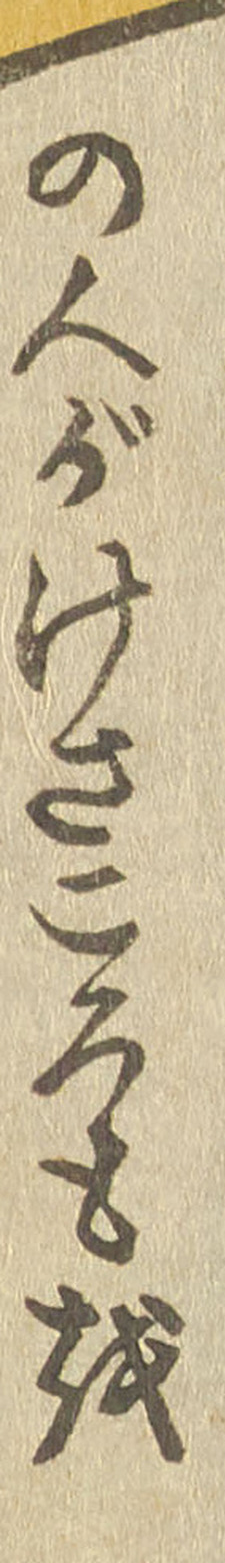の人がけさころもを
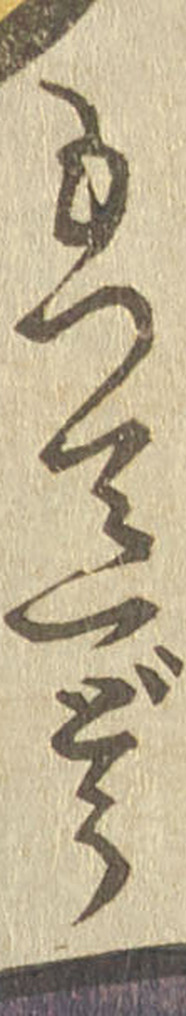もつて一どう
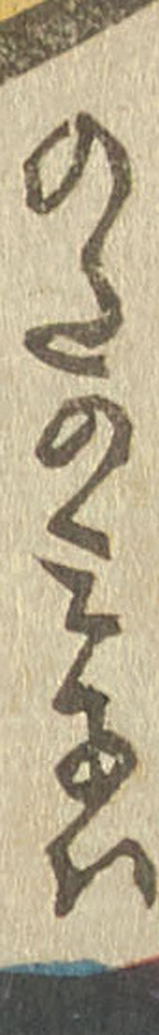のたのみには
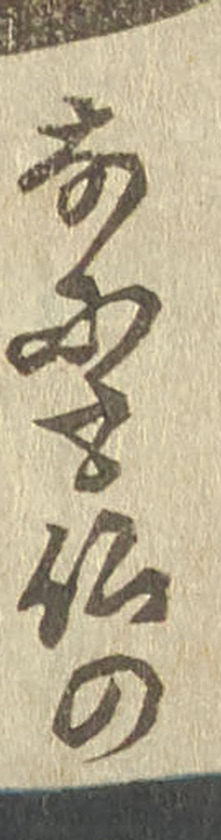なにも仏の
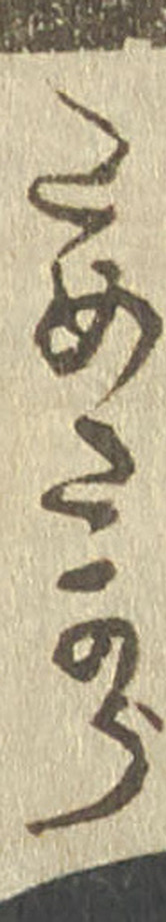ためたから
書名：[じしん百万遍]
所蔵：東京大学総合図書館 General Library in the University of Tokyo, JAPAN
